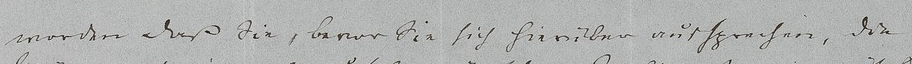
worden daß Sie, bevor Sie sich hierüber aussprechen, die
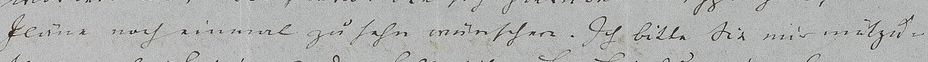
Pläne noch einmal zu sehn wünschen. Ich bitte Sie mir mitzu-
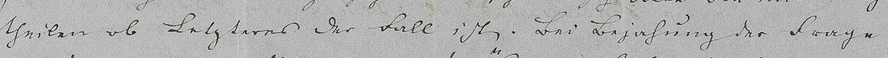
theilen ob Letzteres der Fall ist. Bei Bejahung der Frage
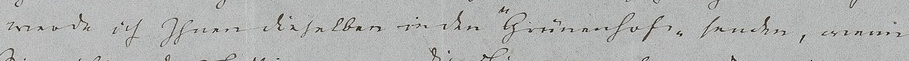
werde ich Ihnen dieselben in den «Grünenhof» senden, wenn
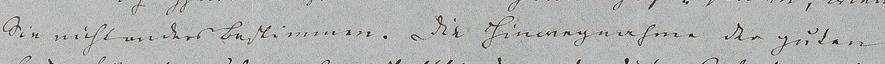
Sie nicht anders bestimmen. Die Hinwegnahme der guten
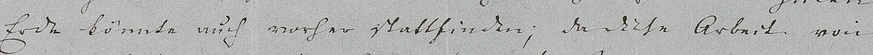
Erde könnte auch vorher stattfinden; da diese Arbeit von
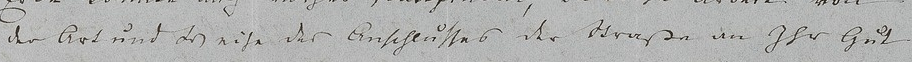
der Art und Weise des Anschlusses der Straße an Ihr Gut
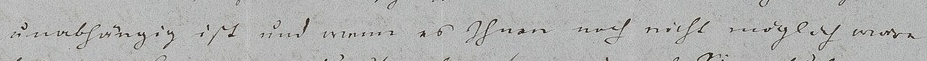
unabhängig ist und wenn es Ihnen noch nicht möglich wäre
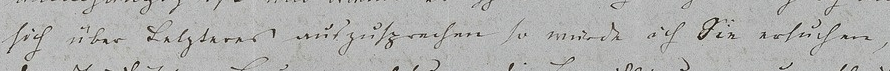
sich über Letzteres auszusprechen so würde ich Sie ersuchen,
